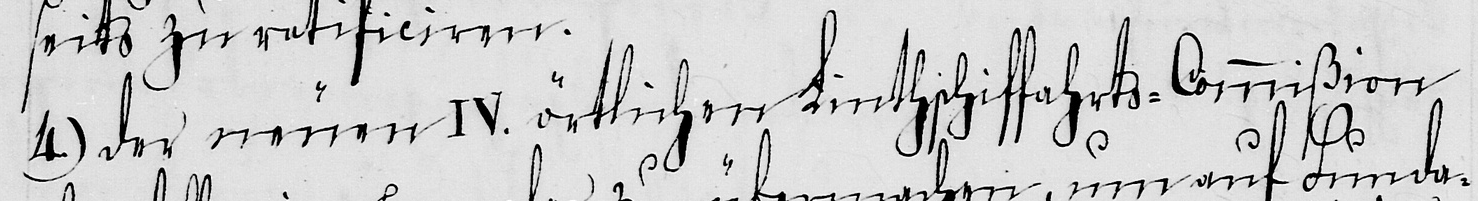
4.) der neuen IV. örtlichen Linthschiffahrts-Commißion
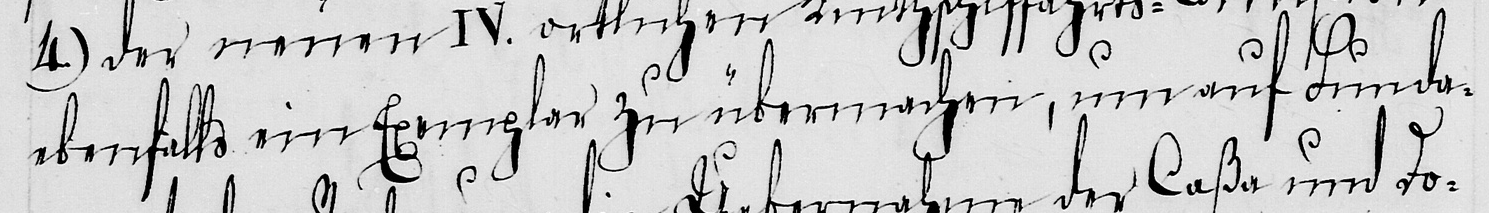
ebenfalls ein Exemplar zu übermachen, um auf Funda¬
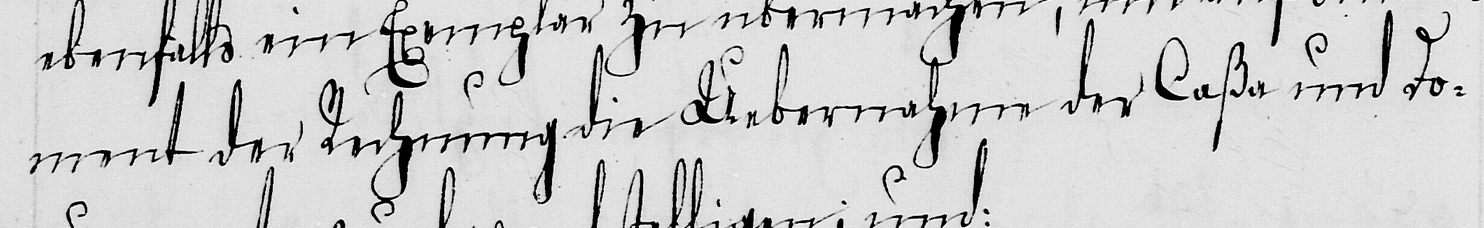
ment der Rechnung die Uebernahme der Caßa und Do¬
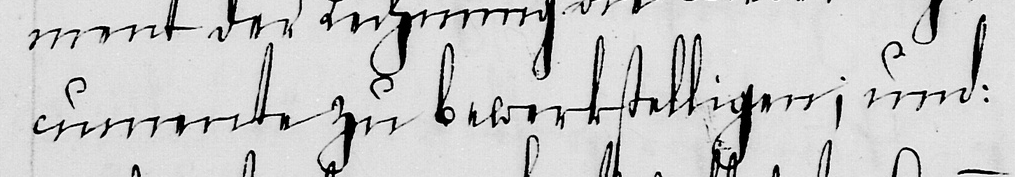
cumente zu bewerkstelligen; und:
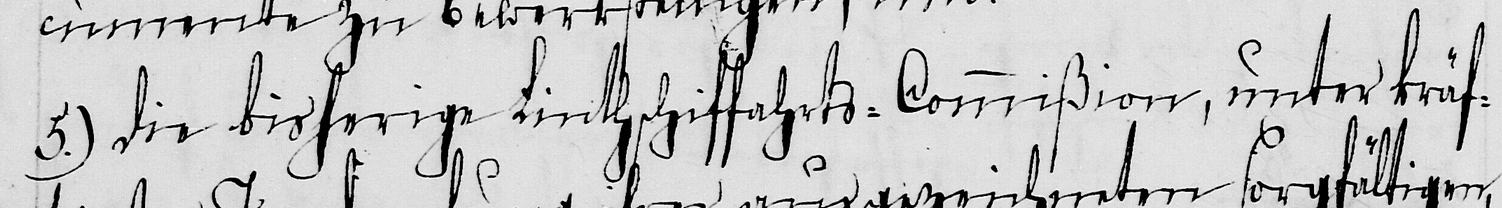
5.) die bisherige Linthschiffahrts-Commißion, unter kräf¬
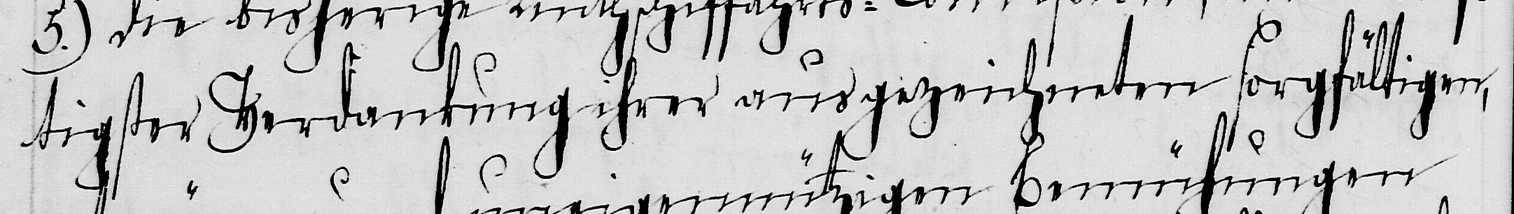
tiger Verdankung ihrer ausgezeichneten sorgfältigen,
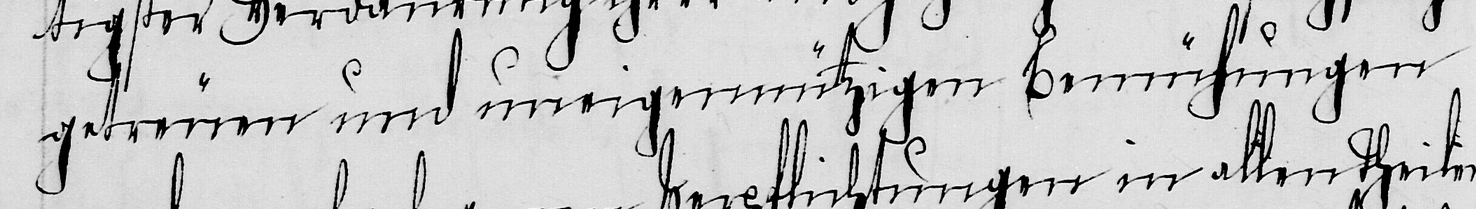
getreuen und uneigennützigen Bemühungen
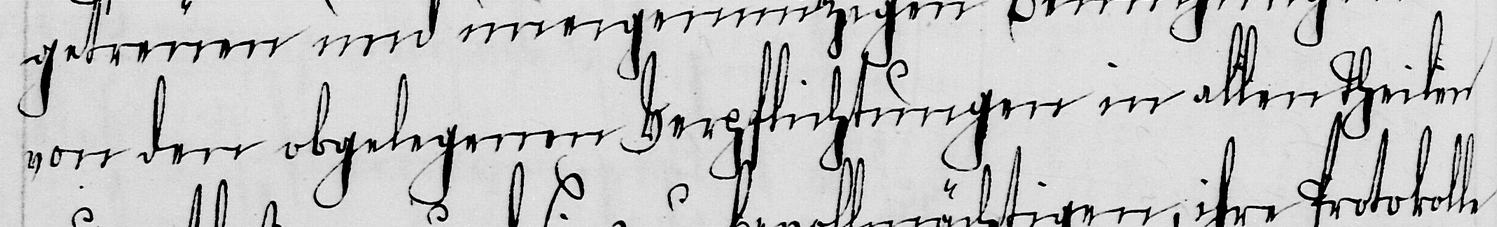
von den obgelegenen Verpflichtungen in allen Theilen
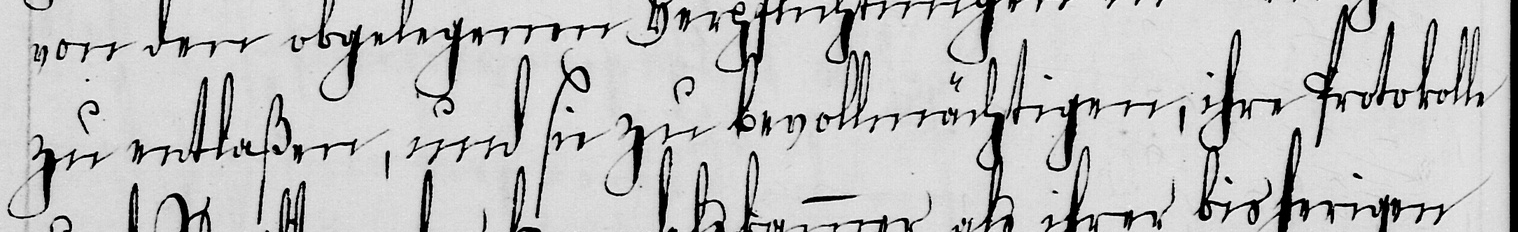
zu entlaßen, und sie zu bevollmächtigen, ihre Protokol¬
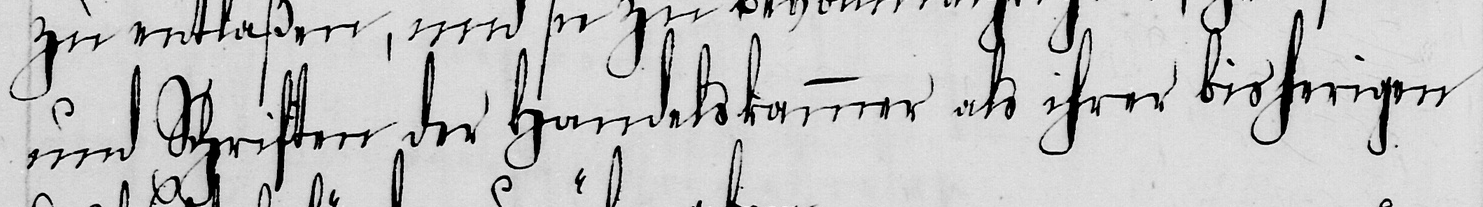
und Schriften der Handelskammer als ihrer bisherigen
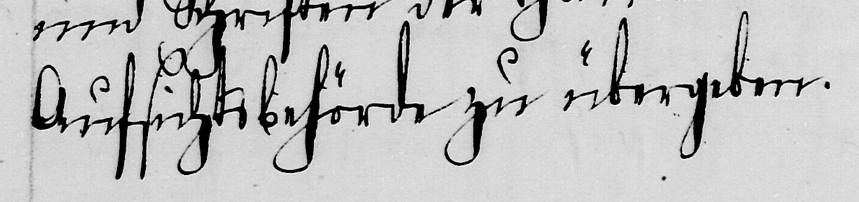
Aufsichtsbehörde zu übergeben.
